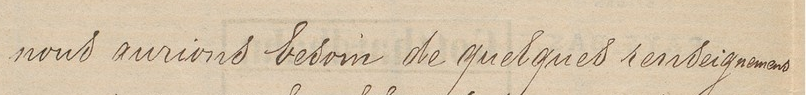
nous aurions besoin de quelques renseignemens
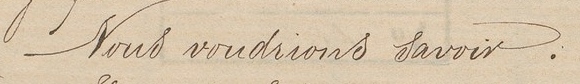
Nous voudrions savoir:
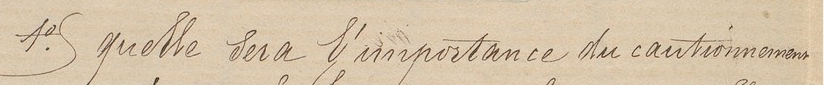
1o quelle sera l'importance du cautionnemens
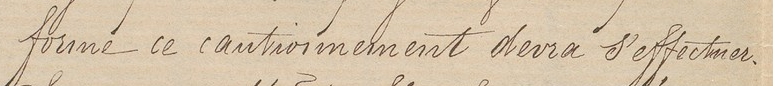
forme ce cautionnement devra s`effectuer.
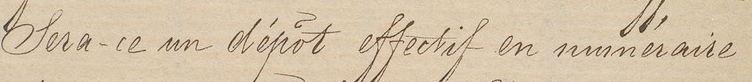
Sera-ce und dépôt effectif en numéraire
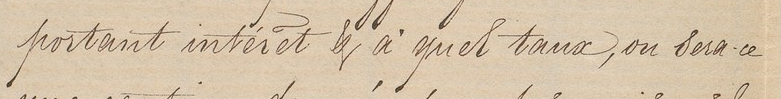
portant intérêt & à quel taux, on sera-ce
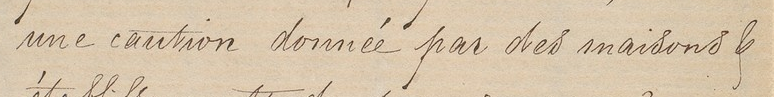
une caution donnée par des maisons &
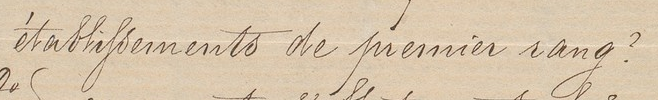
établissements de premier rang?
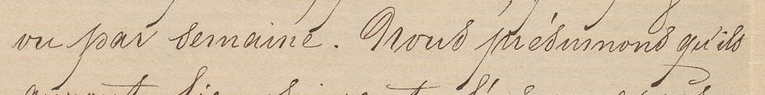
ou par semaine. Nous présumons qu`ils
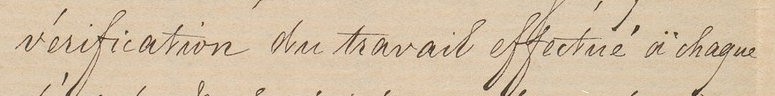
vérification du travail effectué à chaque
